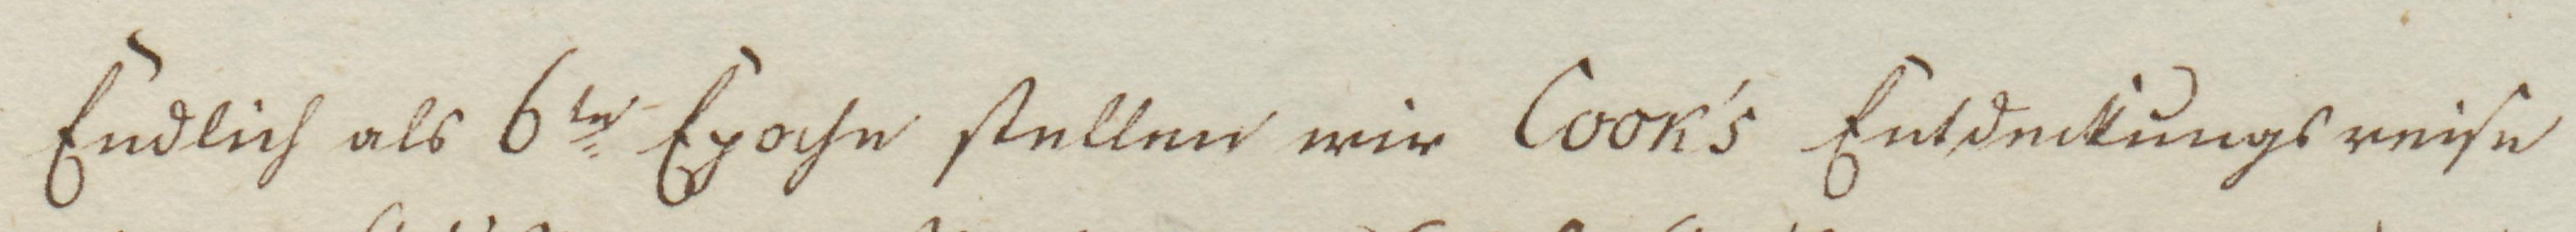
Endlich als 6te Epoche stellen wir Cook's Entdeckungsreise
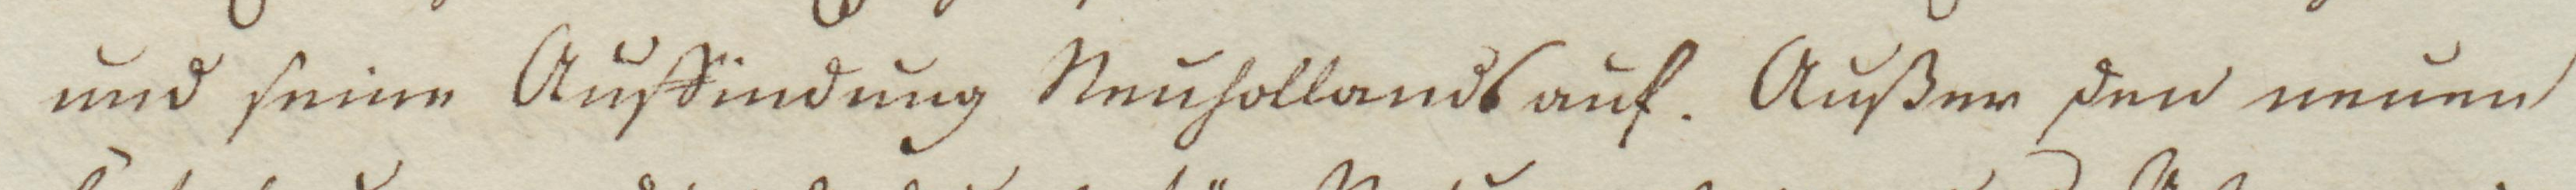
und seine Auffindung Neuhollands auf. Außer den neuen
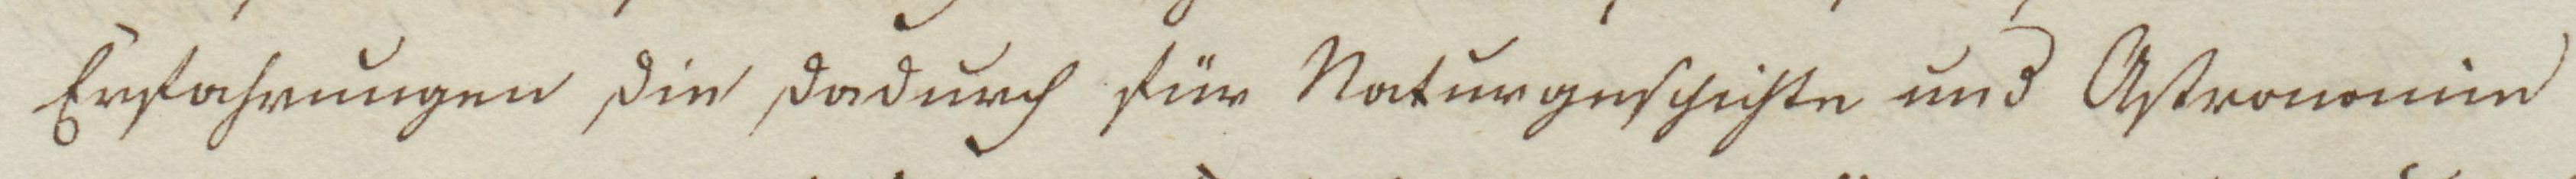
Erfahrungen die dadurch für Naturgeschichte und Astronomie
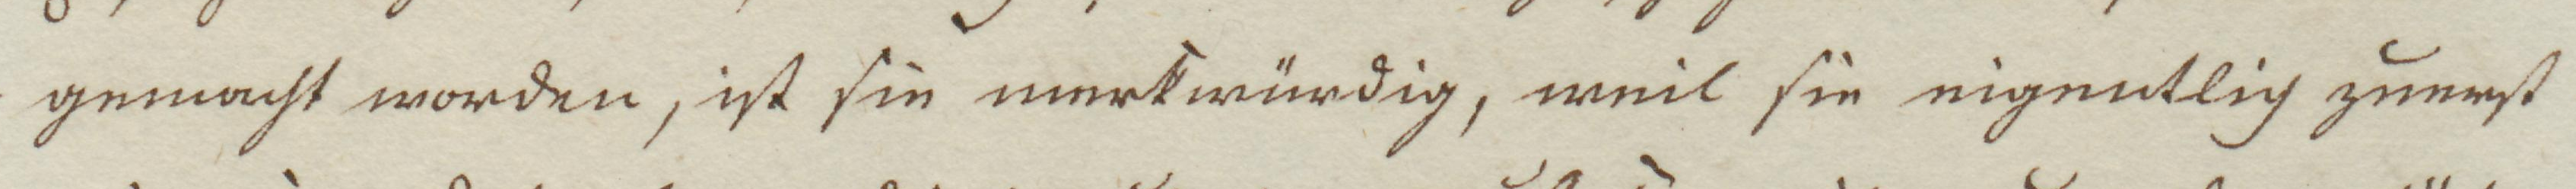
gemacht worden, ist sie merkwürdig, weil sie eigentlich zuerst
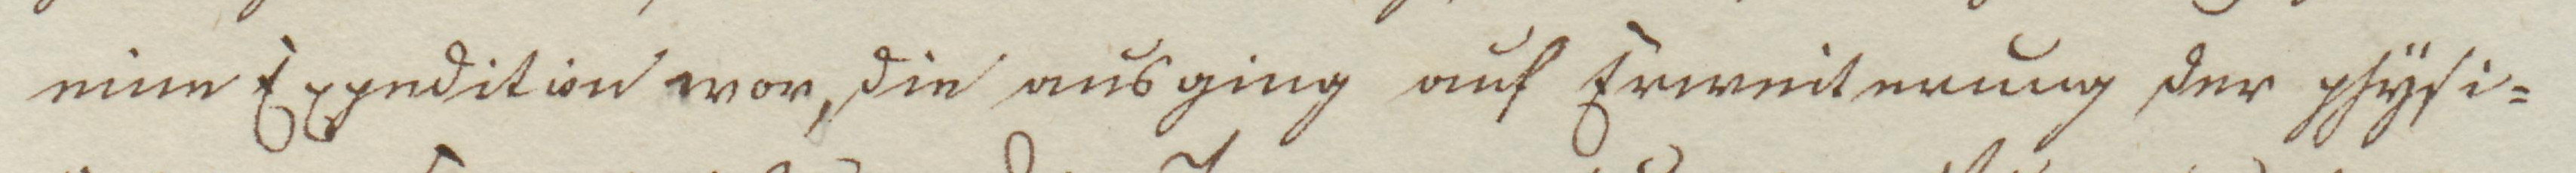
eine Expedition war, die ausging auf Erweiterung der phÿsi-
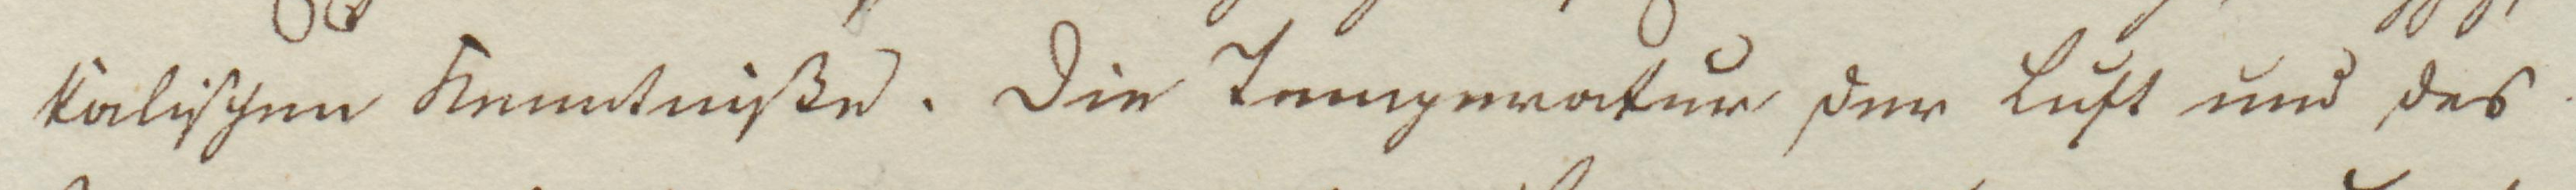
kalischen Kenntniße. Die Temperatur der Luft und des
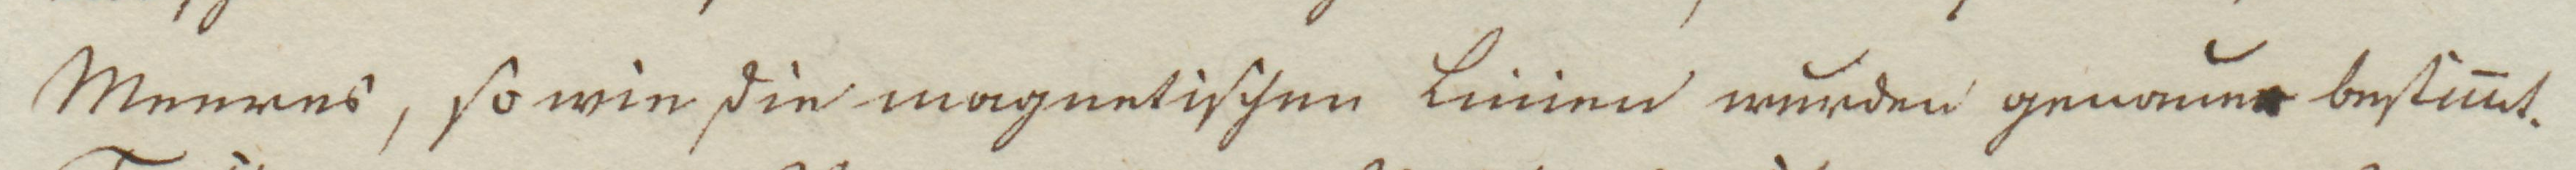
Meeres, so wie die magnetischen Linien wurden genauer bestim̃t.
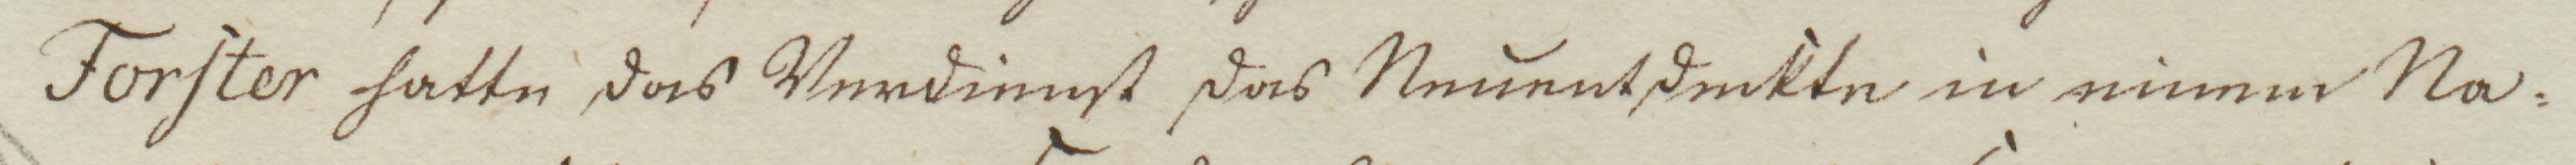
Forster hatte das Verdienst das Neuentdeckte in einem Na-
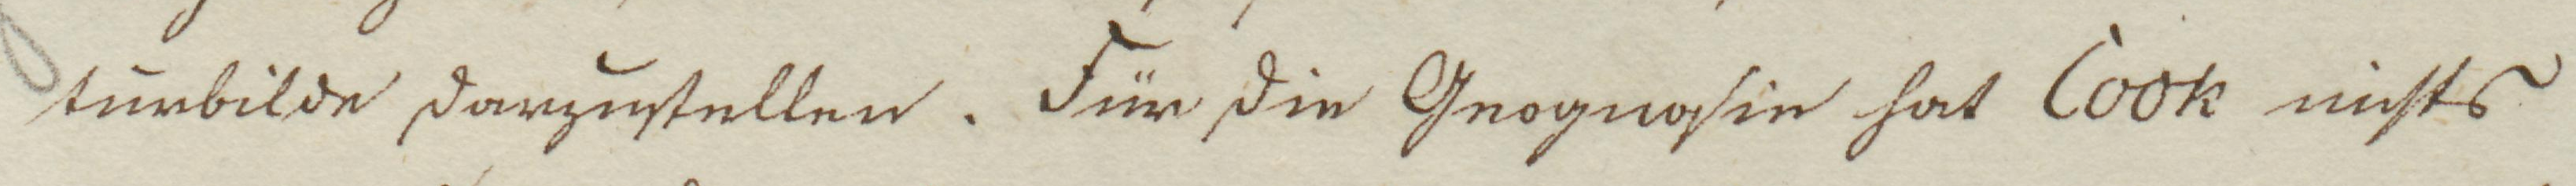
turbilde darzustellen. Für die Geographie hat Cook nichts
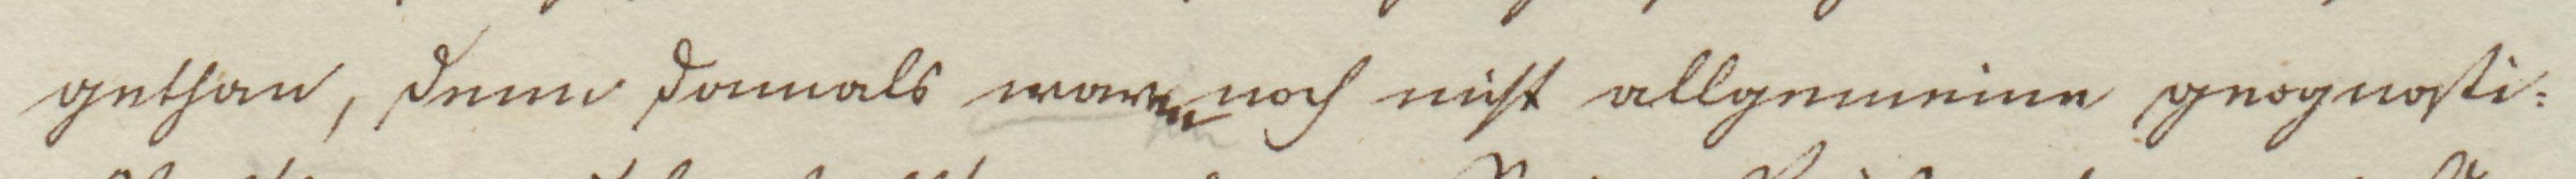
gethan, denn damals waren noch nicht allgemeine geognosti-
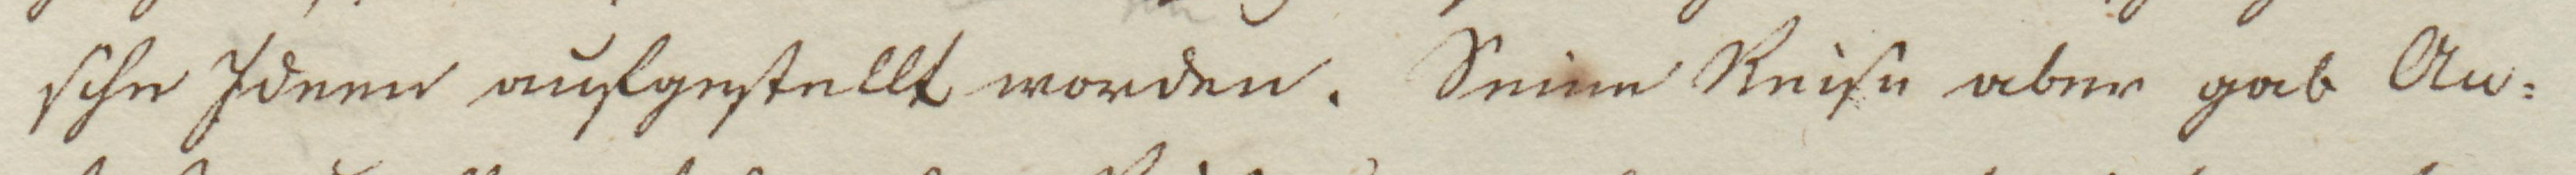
sche Ideen aufgestellt worden. Seine Reise aber gab An-
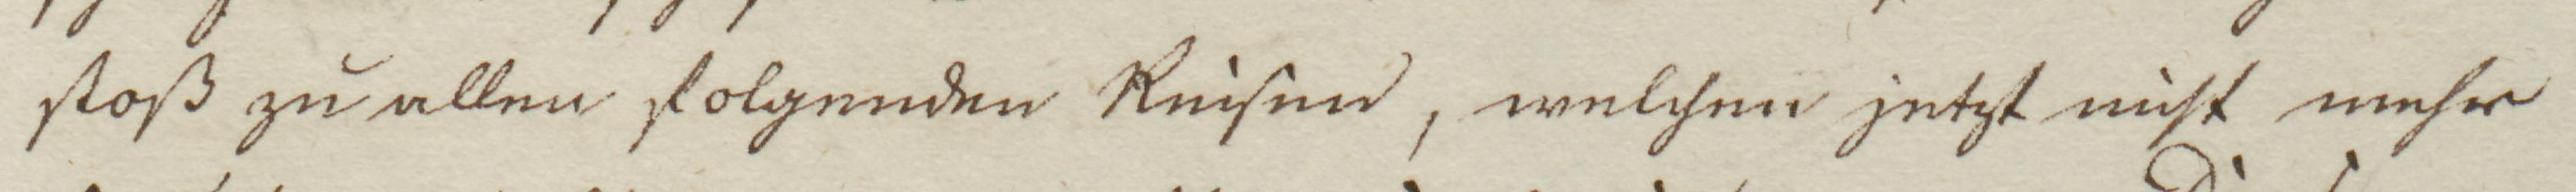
stoß zu allen folgenden Reisen, welchen jetzt nicht mehr
